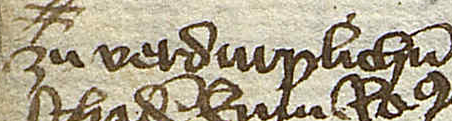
ʒu verdurplich*n
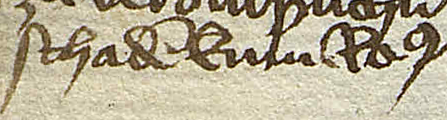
ſchade* kum Ro*
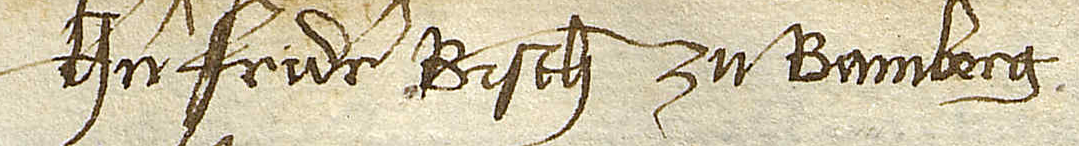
H*n Fridr* Biſch* ʒu Bamberg
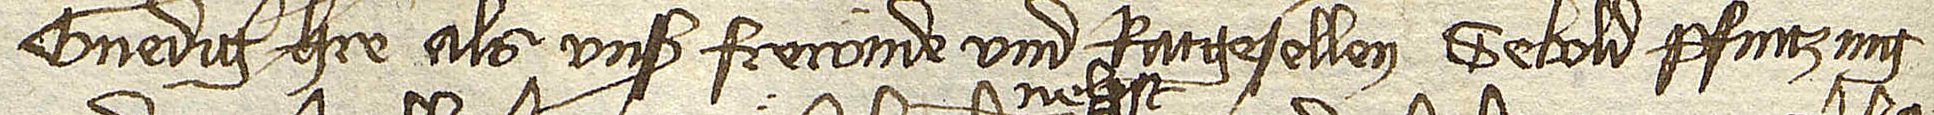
Gnedig* h*re als vnſ* frewnde vnd Ratgeſellen Sebold Pfincʒing
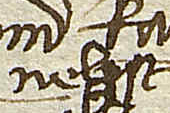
nehſt
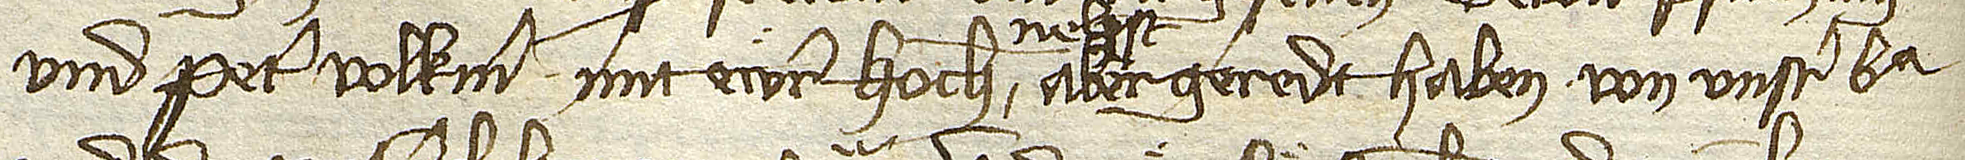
vnd Pet* volkm* mit ew*r hoch* aber geredt haben . von vnſ*r b*
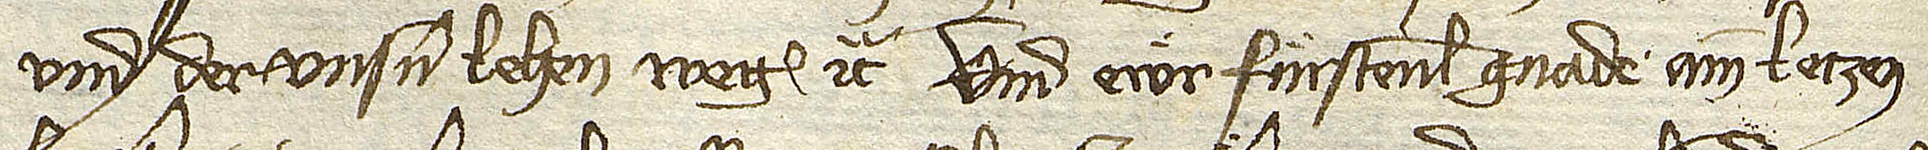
vnd der vnſ*n lehen weg* ec* Vnd ewr fürſtenl* gnade . am* lecʒen
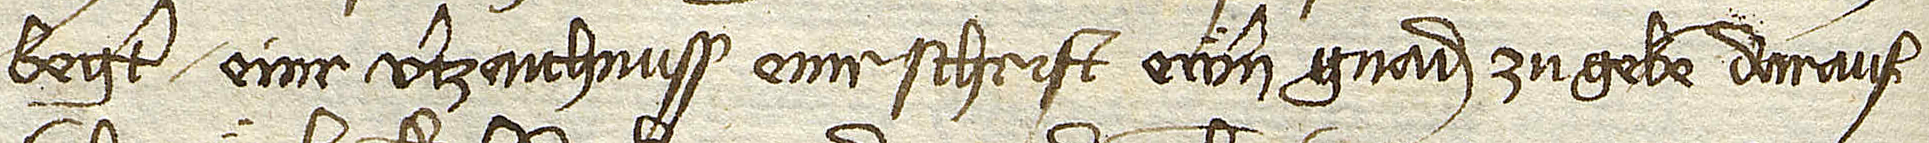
beg*t / einr v*cʒaichnuſſ einr ſchrift ew*n gnad* ʒu gebe* darauf
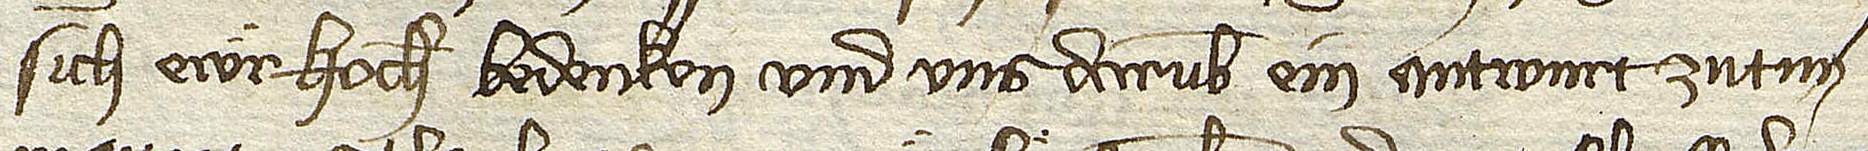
ſich ewr hoch* bedenken vnd vns daru*b ein antwurt ʒutun
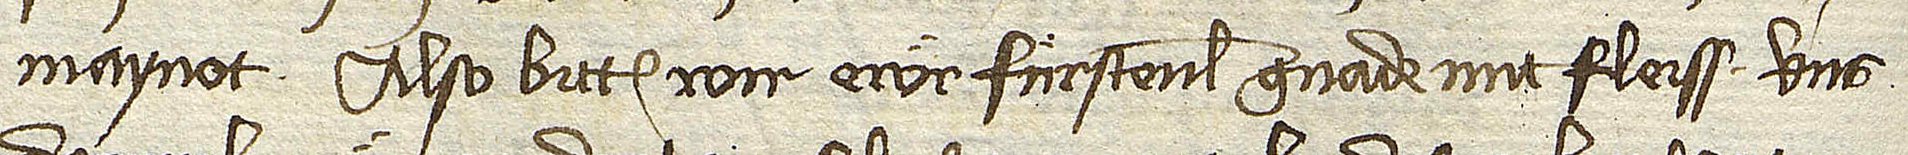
maynot . Alſo bitt* wir ewr fürſtenl* gnade mit fleiſſ . Vns
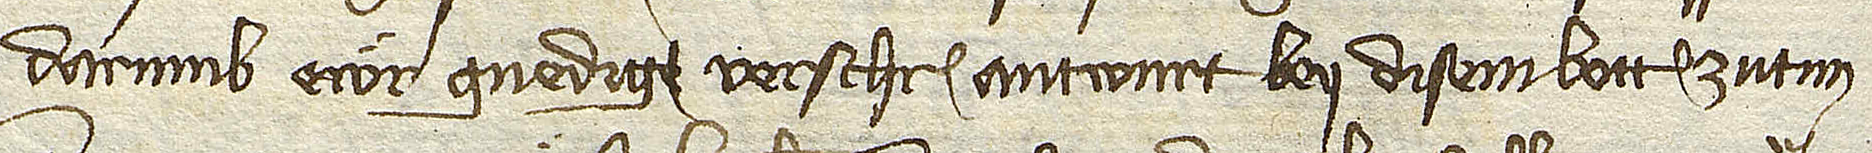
darumb ewr gnedige verſchr* antwurt bey diſem bott* ʒutun
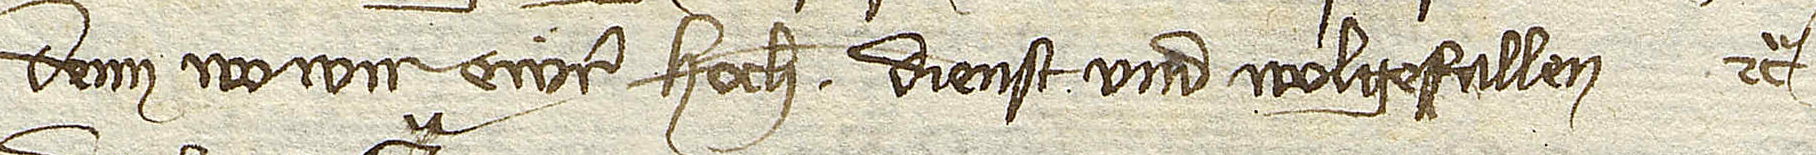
Denn wo wir ew*r hoch* . dienſt vnd wolgefallen ec*
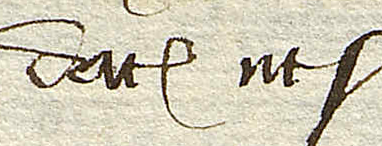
Dat* ut ſ*
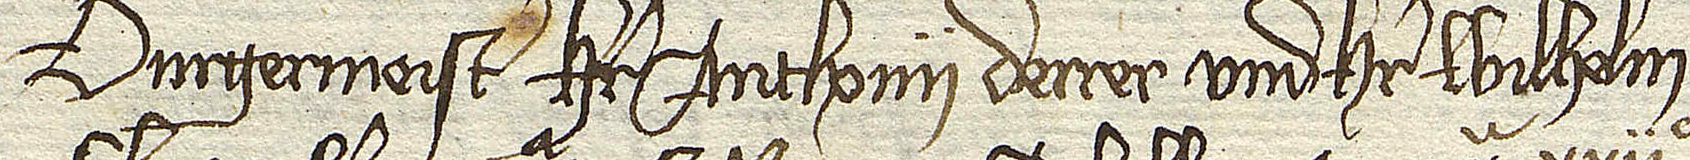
Burgermeiſt* H*r Anthonii derrer vnd H*r Wilhelm
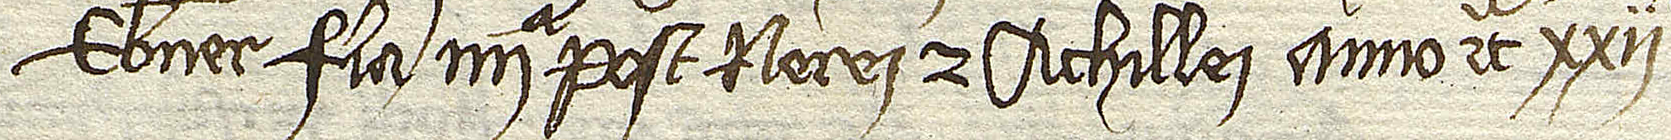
Ebner fia* iiii* poſt Nerei @ Achillei anno ec* xxii*
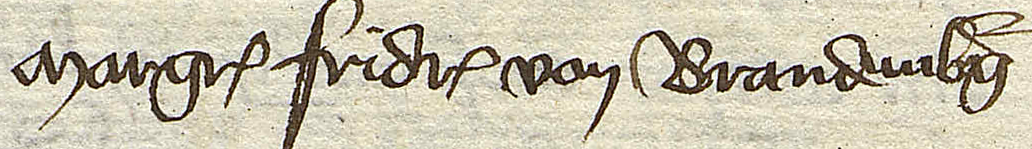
Margr* Fridr* von Brandemb*g
